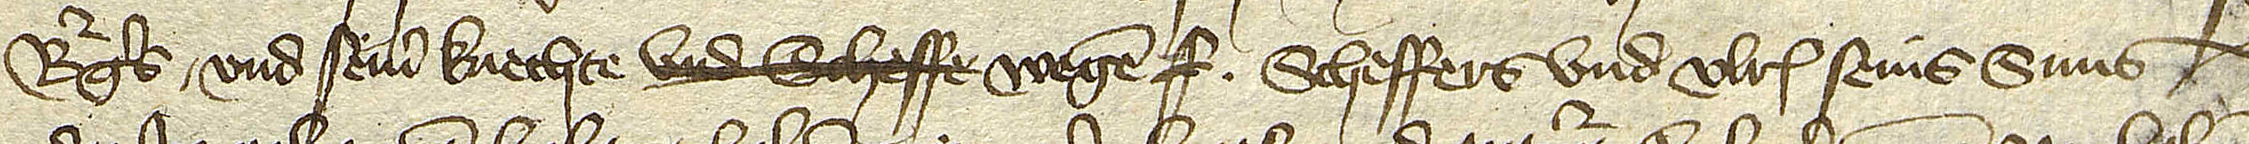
B*g*s / vnd ſein* knechte vnd Scheffe wege* F . Scheffers vnd vlr* ſeins Suns /
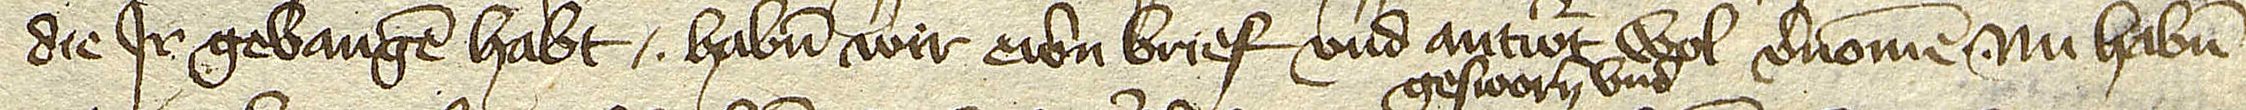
die Ir gevange* habt / . habn* wir ew*n brief vnd antw*t wol v*nome* . Nu habn*
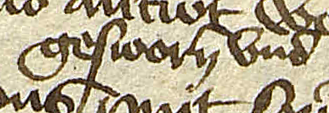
geſworn* vnd
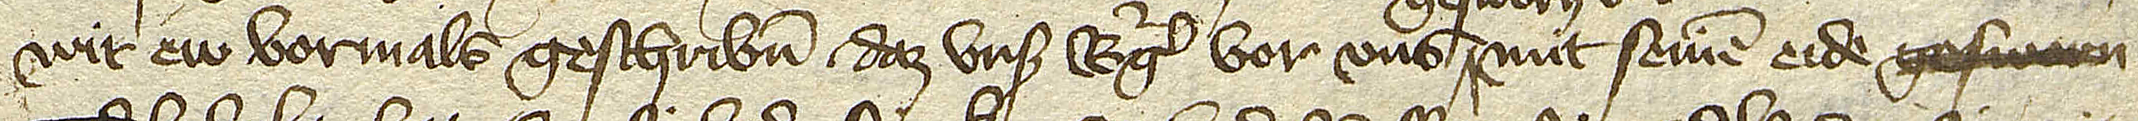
wir ew vormals geſchribn* / daʒ vnſ* B*g* vor vns mit ſeine* eide geſworn
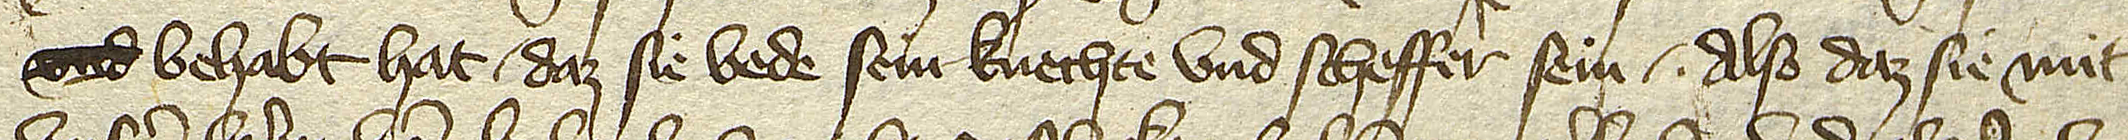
vnd behabt hat / daʒ ſie bede ſein knechte vnd ſcheffer ſein / . Alſo daʒ ſie mit
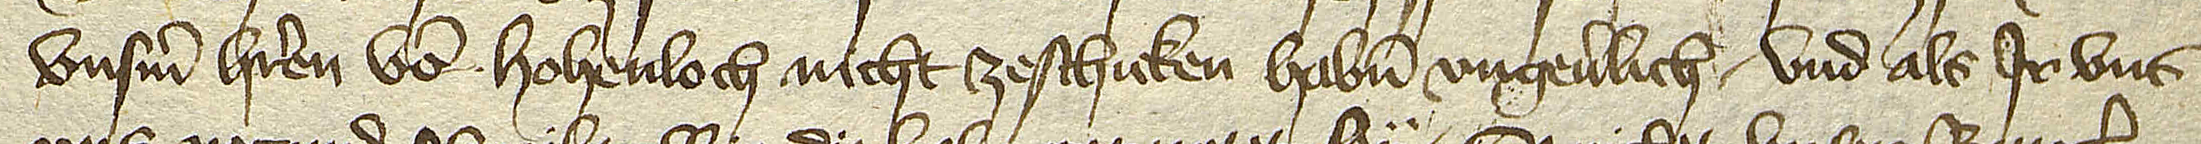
vnſm* hr*en vo* hohenloch nicht cʒeſchicken habn* vugeu*lich / vnd als Ir vns
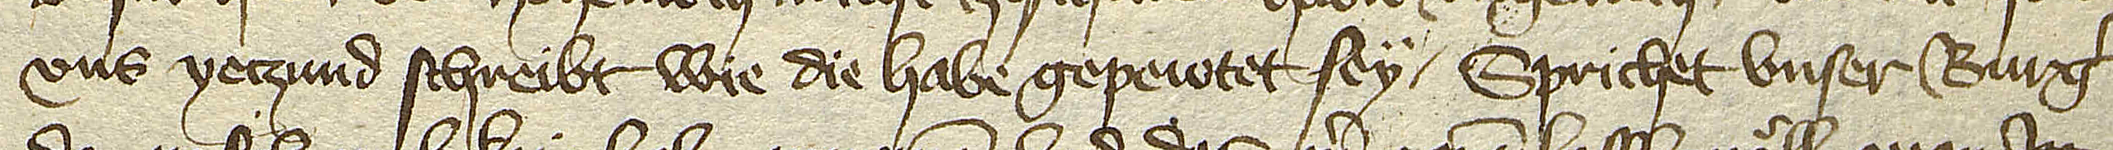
vns yecʒund ſchreibt wie die habe gepewtet ſey / Sprichet vnſer Burg*
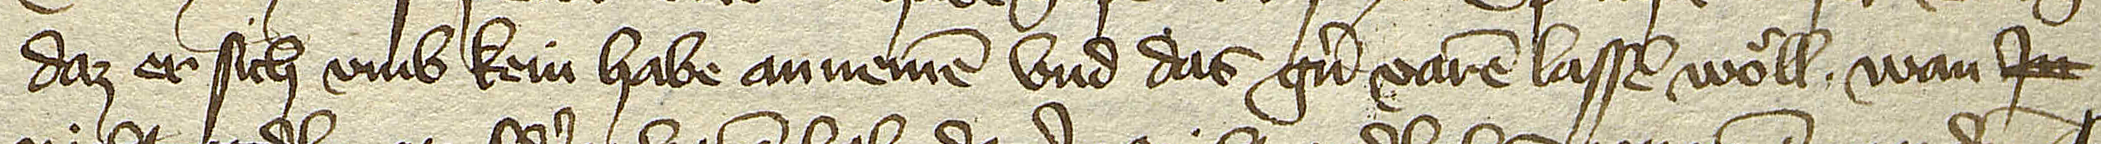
daʒ er ſich vmb kein habe anneme* vnd das gn* vare* laſſe* wöll . wan In
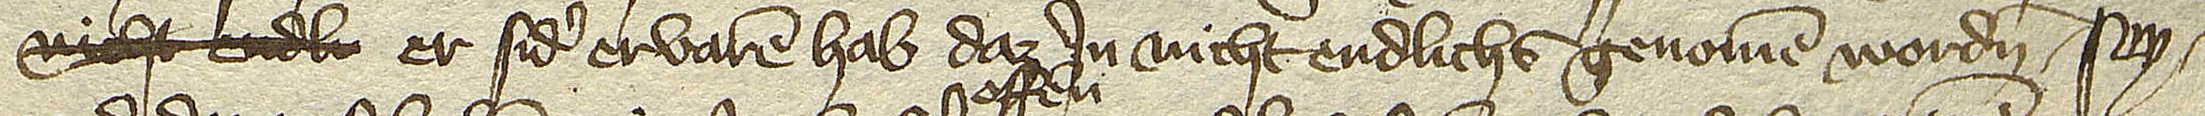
nicht endl er ſid* ervare* hab daʒ In nicht endlichs genome* wordn* / ſey /
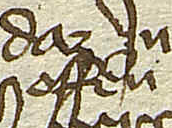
offen*
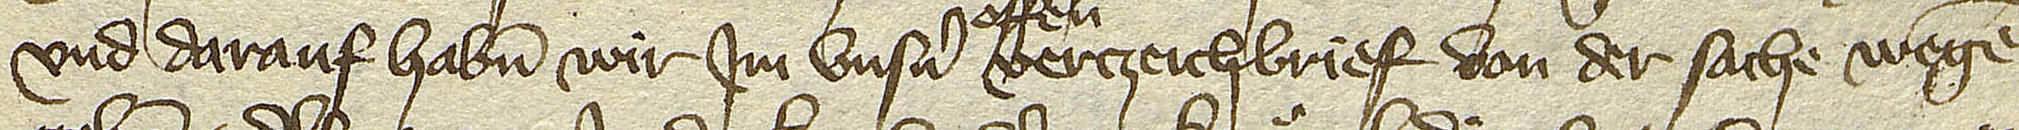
vnd darauf habn* wir Im vnſn* vercʒeichbrief von der ſache wege*
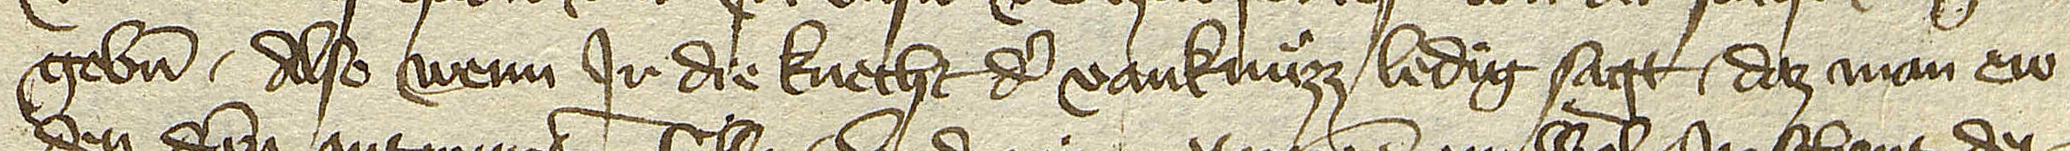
gebn* / Alſo wenn Ir die knecht d* vanknüʒʒ ledig ſagt / daʒ man ew
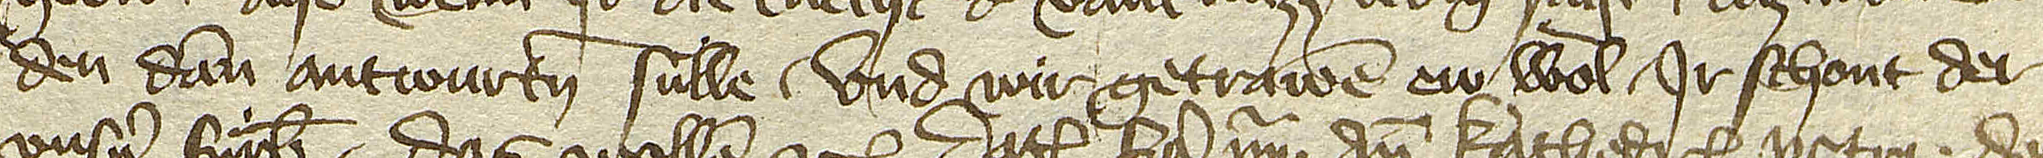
den dan* antwurtn* ſülle / vnd wir getrawe* ew wol / Ir ſchont der
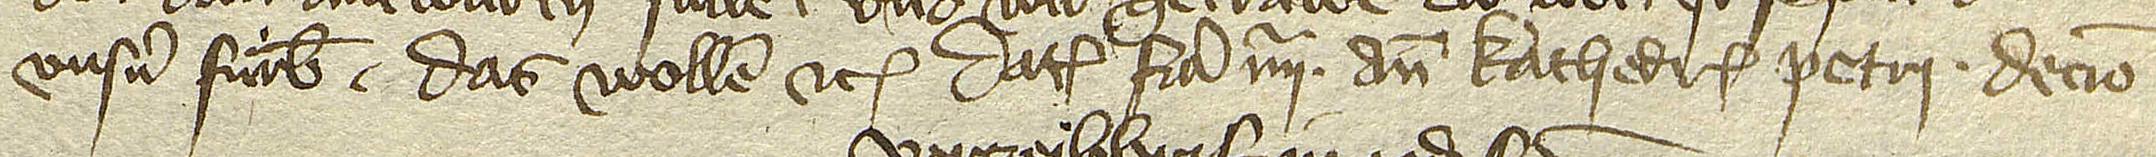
vnſn* fürb* / das wolle* ec* Dat* fia* iiii* . An* Kathedr* petri ~ decio*
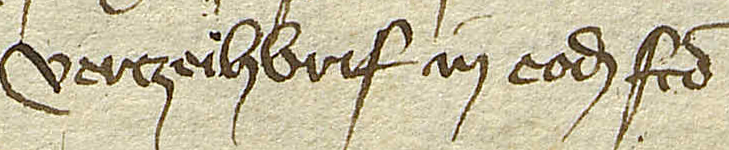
vercʒeihbrif in eod* f%%*
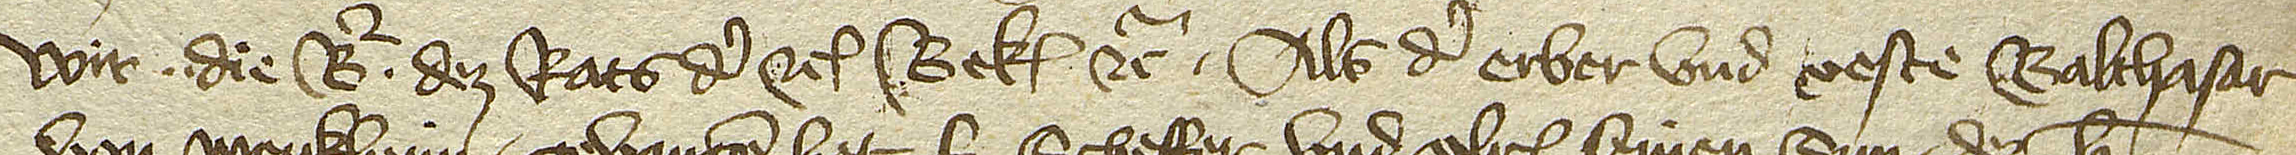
Wir ~ die B* . deʒ Rats d* ec* Bek* ec* / Als d* erber vnd veſte Balthaſar
